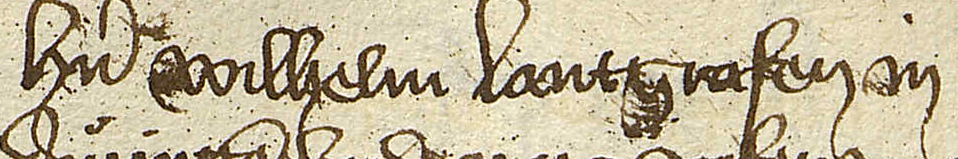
hn* wilhelm lantgrafen in
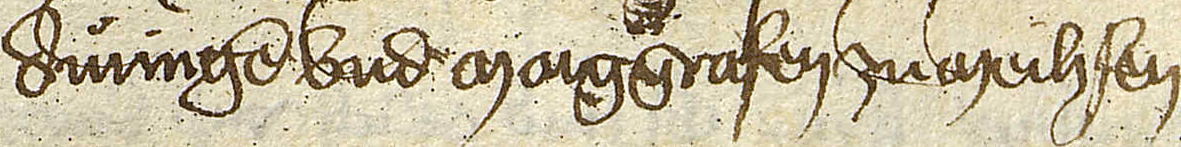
düringe* vnd Marggrafen cʒu Meihſen
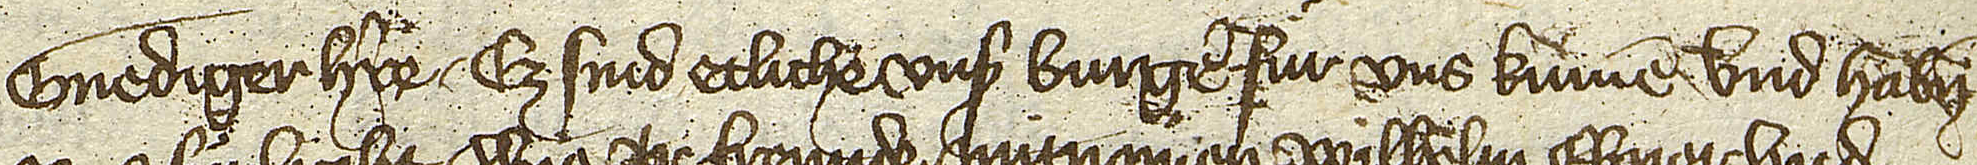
Gnediger h*re / Eʒ ſind etliche vnſ* burge* für vns kume* vnd habn*
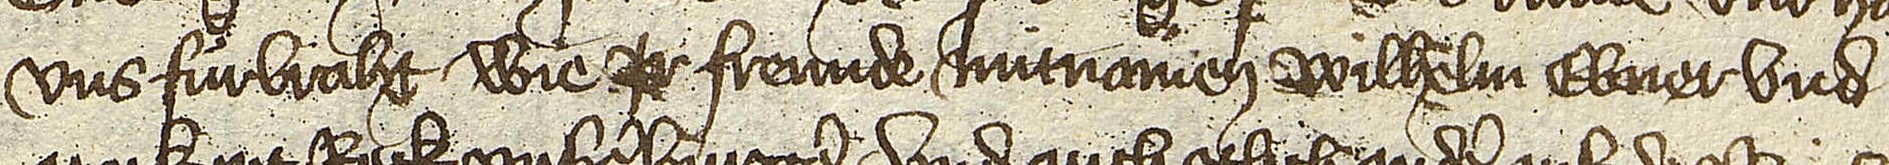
vns fürbraht / wie Ir freunde mitnamen wilhelm Ebner vnd
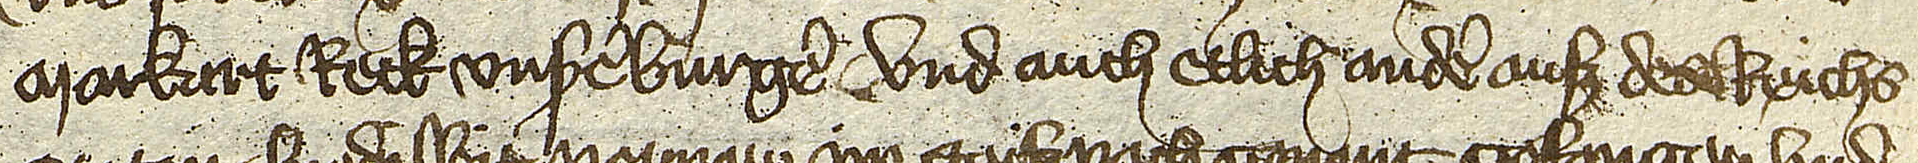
Markart Reck vnſ*e burge* / vnd auch etlich ande* auſʒ des Reichs
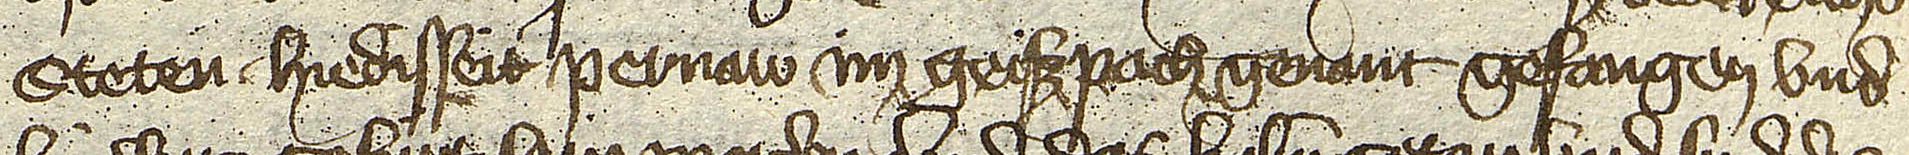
Steten / hiediſſeit pernaw im geiſʒpach genant gefangen vnd
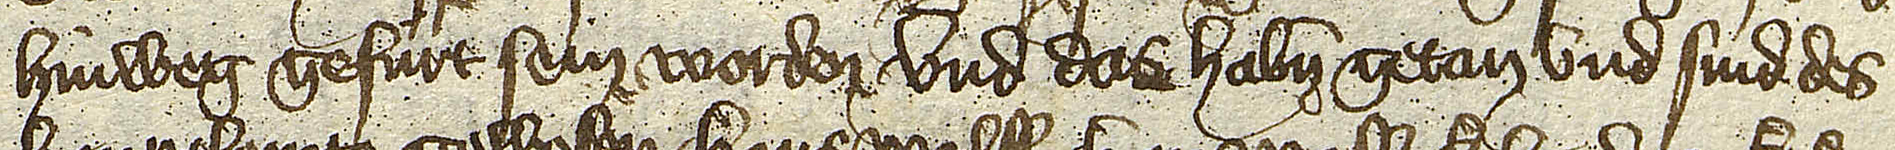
hinweg gefürt ſein worden / vnd das habn* getan vnd ſind des
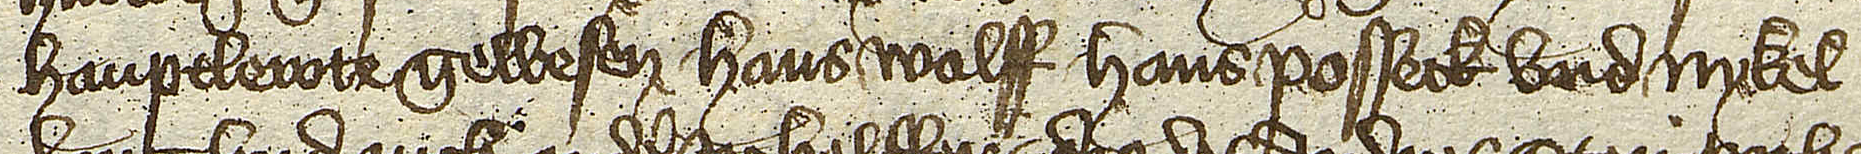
hauptlewte geweſen hans wolff hans poſſeck vnd Nykel
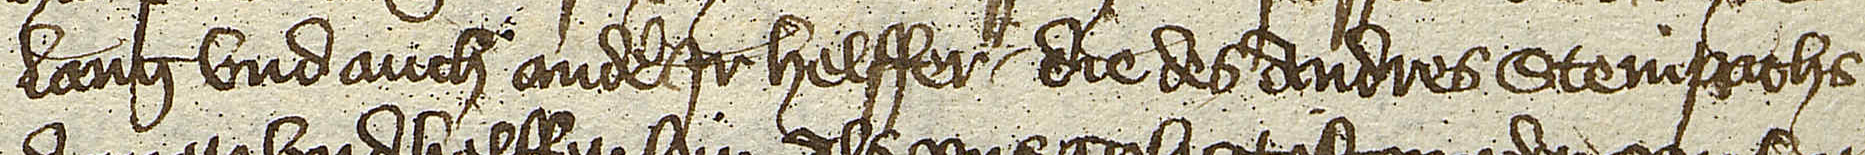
lang vnd auch ande* Ir helffer / die des Andres Steinpachs
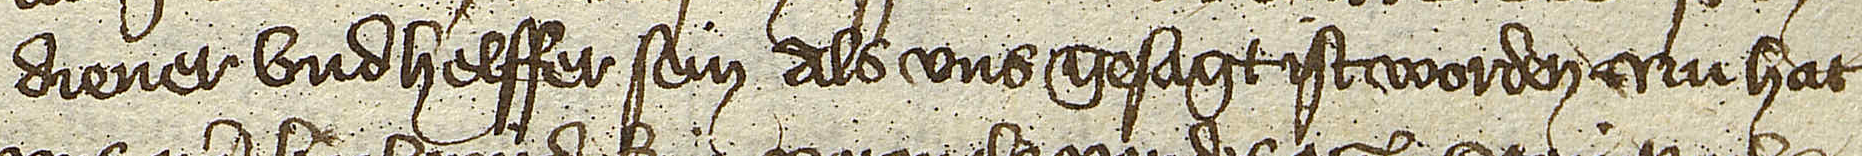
diener vnd helffer ſein Als vns geſagt iſt worden Nu hat
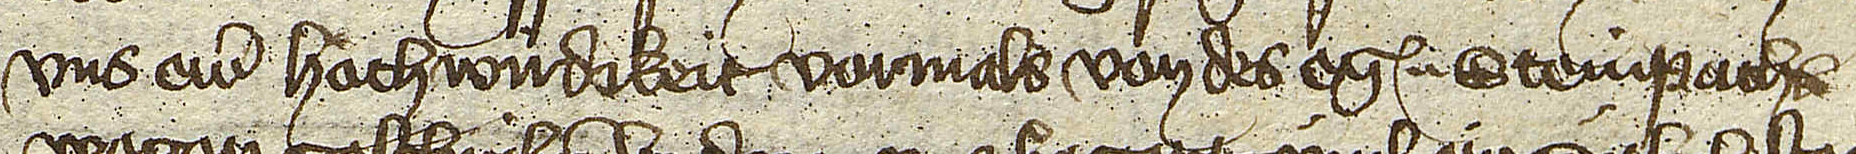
vns ew* hochwirdikeit vormals von des eg* ~ Steinpachs
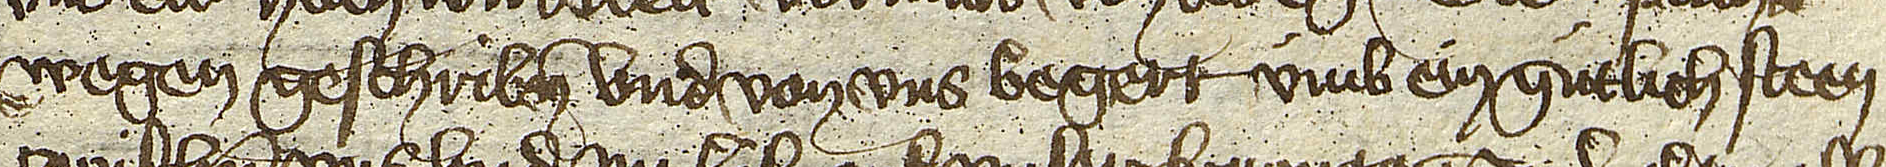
wegen geſchribn* vnd von vns begert v̈mb ein gütlich ſteen
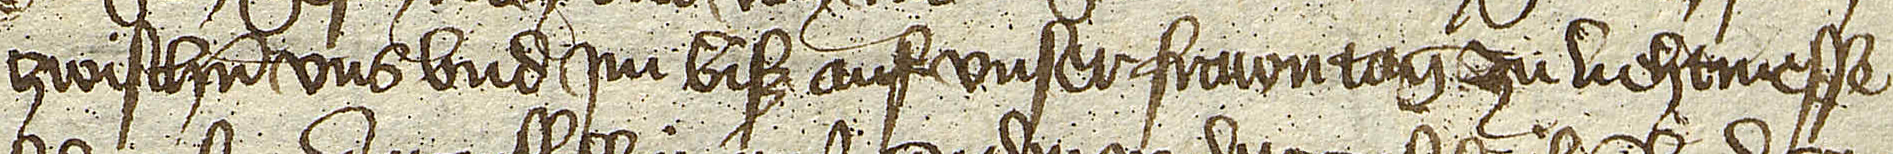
cʒwiſchn* vns vnd Im biſʒ auf vnſer frawntag cʒu lichtmeſſe
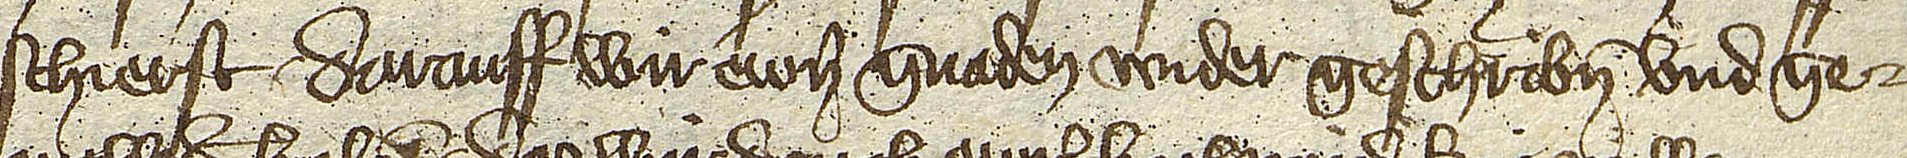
ſchierſt / darauff wir ewn* gnaden wider geſchribn* vnd ge =
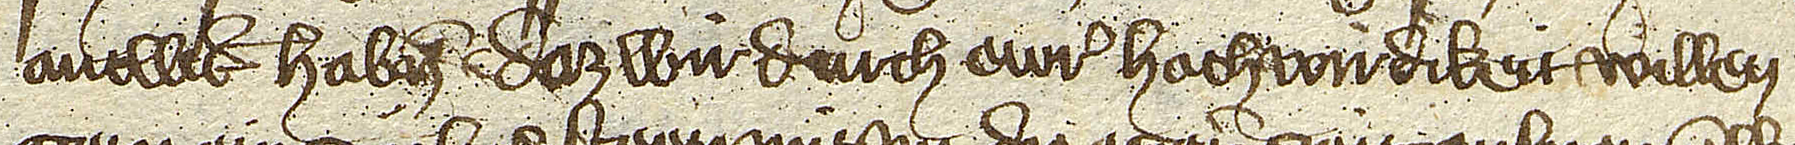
antwt* habn* / daʒ wir durch ewr* hochwirdikeit willen
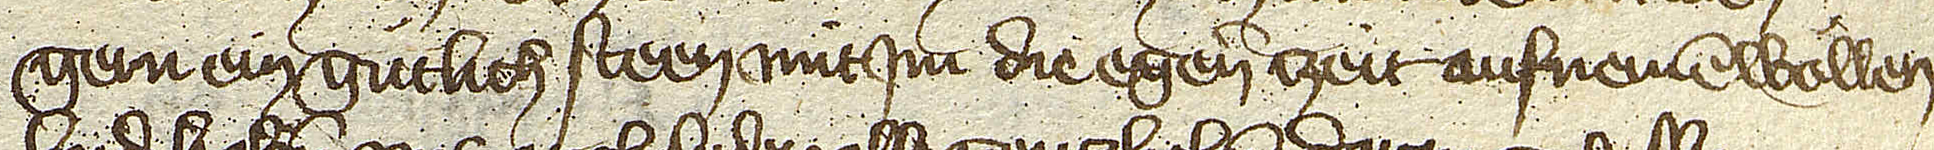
gern ein gütlich ſteen mit Im die egen* cʒeit aufneme* wöllen
